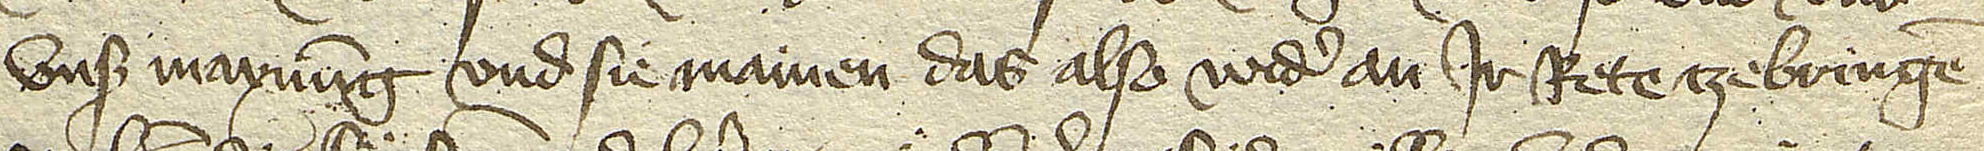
vnſ* maynug* vnd ſie mainen das alſo wid* an Ir Rete cʒebringe*
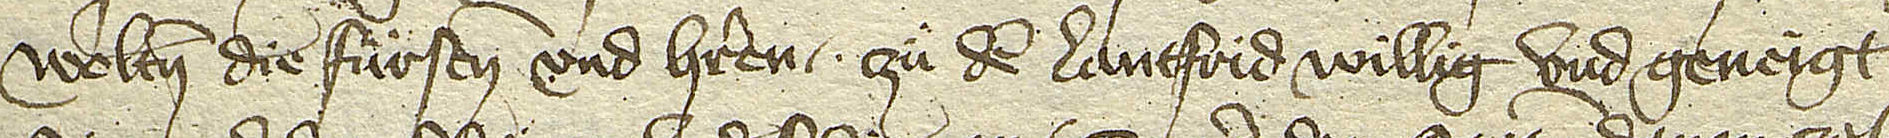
woltn* die fürſtn* vnd hr*en / . cʒü d* lantfrid willig vnd geneigt
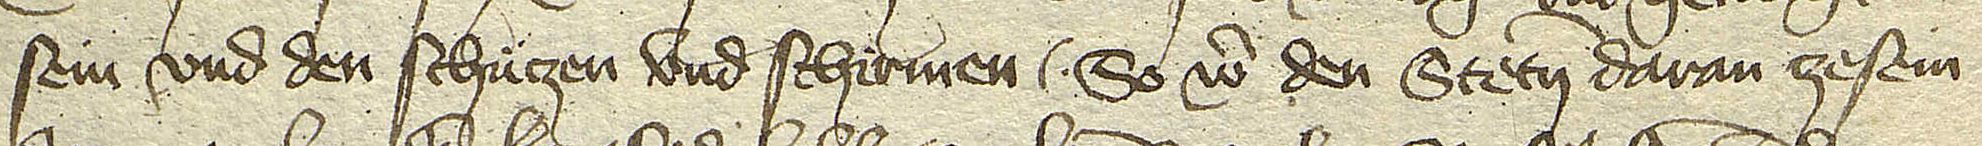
ſein vnd den ſchücʒen vnd ſchirmen / . So w* den Stetn* daran cʒeſein
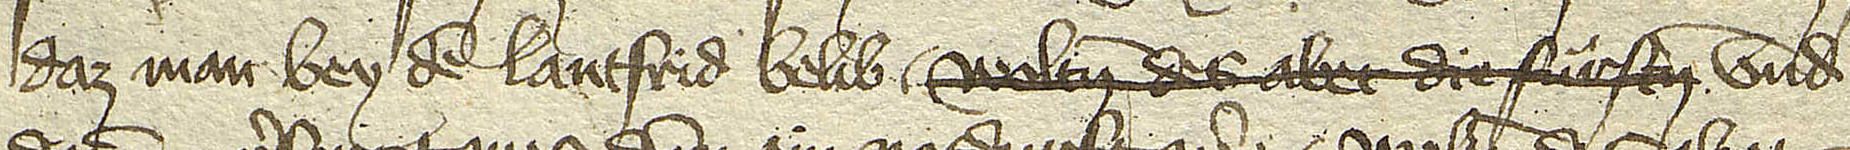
daʒ man bey d* lantfrid belib / woltn* des aber die fürſtn* vnd
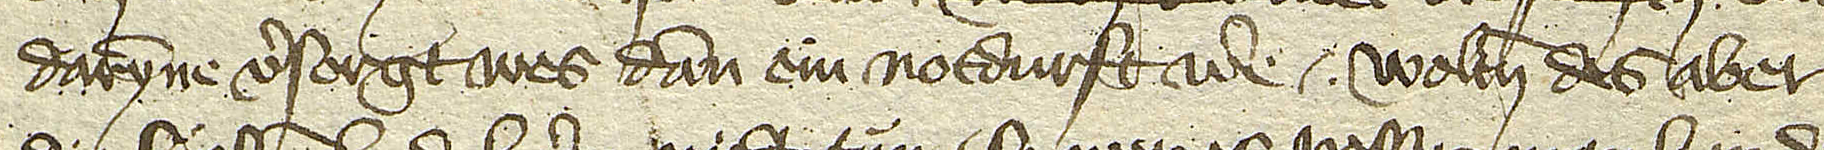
daryne* v*ſorgt wes dan* ein notdurft w*e / . woltn* des aber
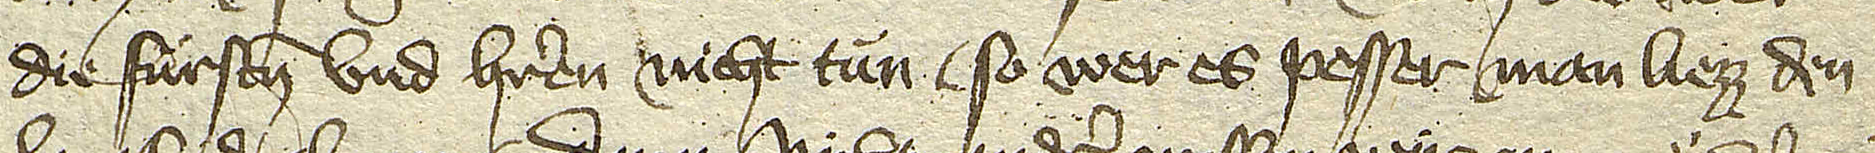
die fürſtn* vnd hr*en nicht tün / ſo wer es peſſer man lieʒʒ den
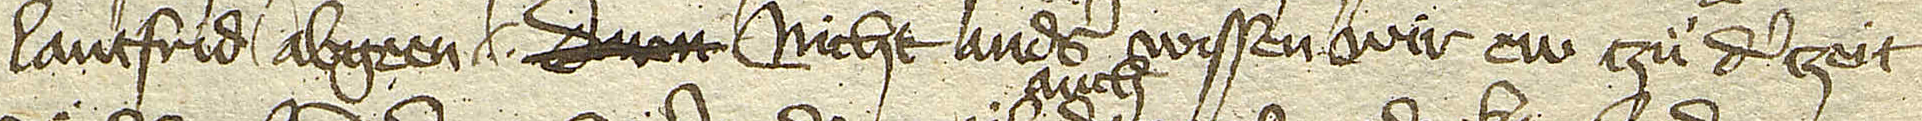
lantfrid abgeen / . Dauon Nicht ands* wiſſen wir ew cʒü d* cʒeit
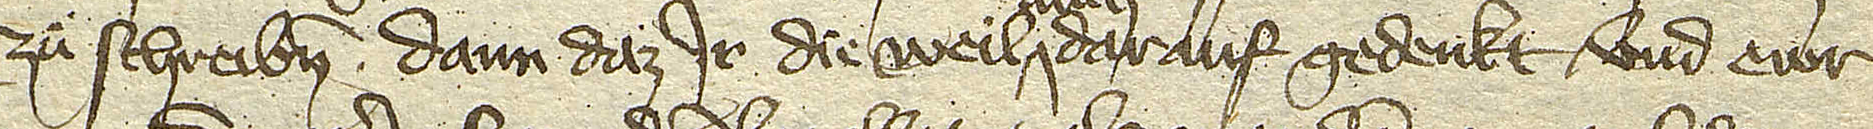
cʒü ſchreibn* dann daʒ ir die weil darauf gedenkt / vnd ewr
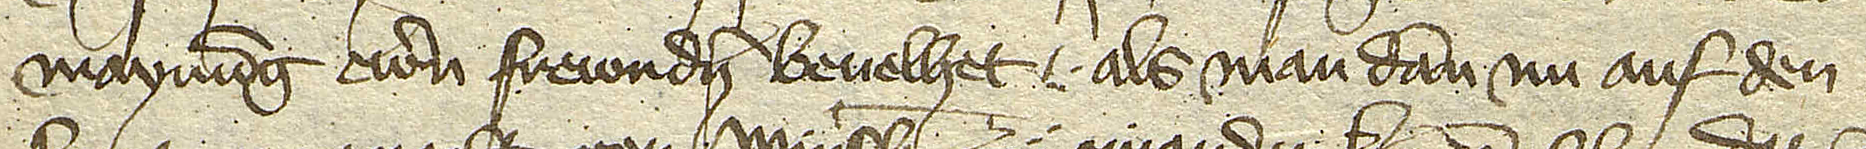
maynug* ew*n frewndn* beuelhet / als man dan* nu auf den
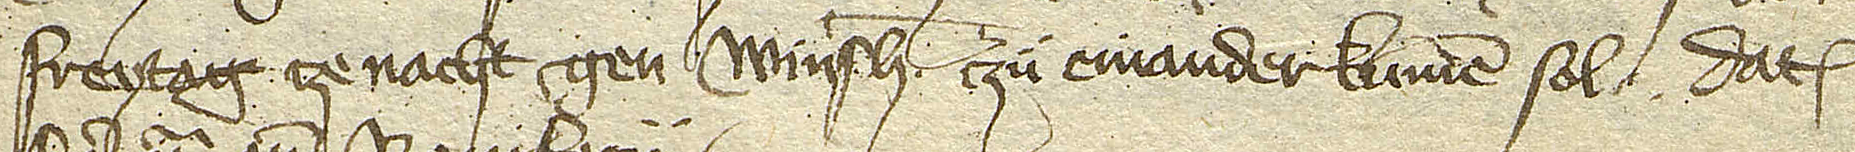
freytag cʒe nacht gen winſh* . cʒü einander kume* ſol / dat*
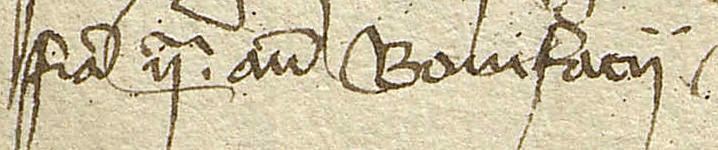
fia* ii* . an* Bonifacii /
